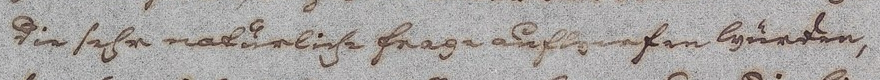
die sehr natürliche Frage aufwerfen würden,
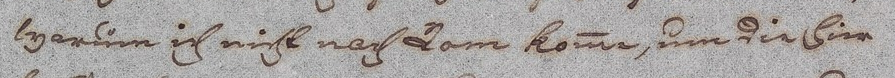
warum ich nicht nach Rom komme, um die hier
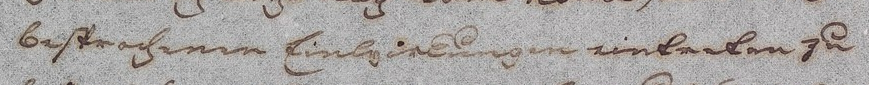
besprochenen Einwirkungen eintreten zu
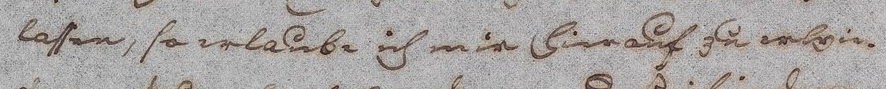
lassen, so erlaube ich mir hierauf zu erwie-
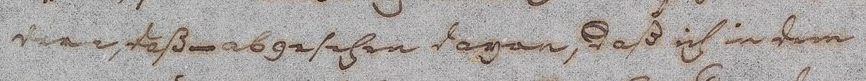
dern, daß – abgesehen davon, daß ich in dem
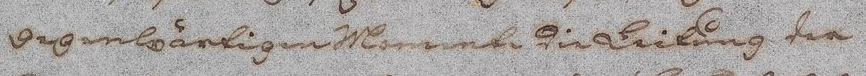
gegenwärtigen Momente die Leitung der
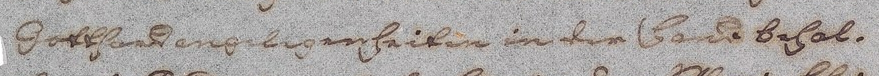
Gotthardangelegenheiten in der Hand behal-
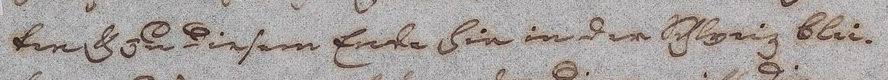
ten & zu diesem Ende hin in der Schweiz blei-
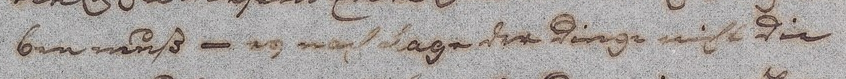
ben muß – es nach Lage der Dinge nicht die
